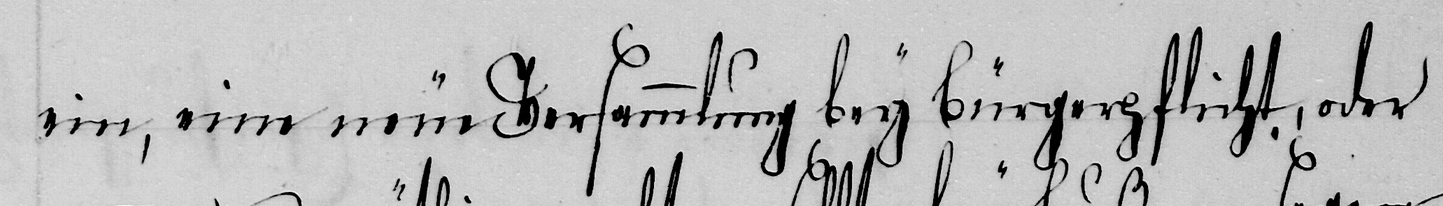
ein, eine neue Versammlung bey Bürgerpflicht, oder
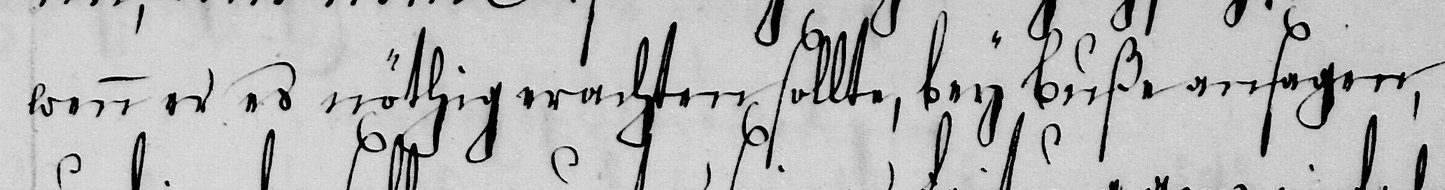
wenn er es nöthig erachten sollte, bey Buße ansagen,
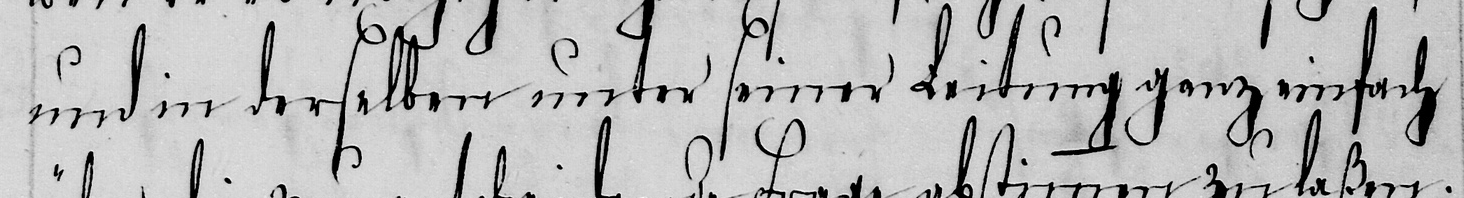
und in derselben unter seiner Leitung ganz einfach
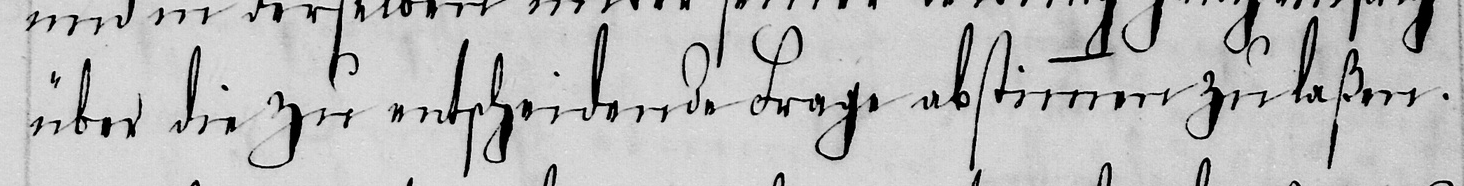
über die zu entscheidende Frage abstimmen zu laßen.
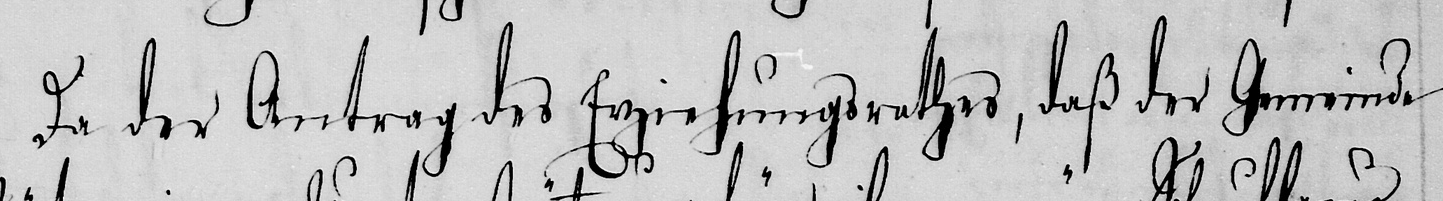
Da der Antrag des Erziehungsrathes, daß der Gemeinde
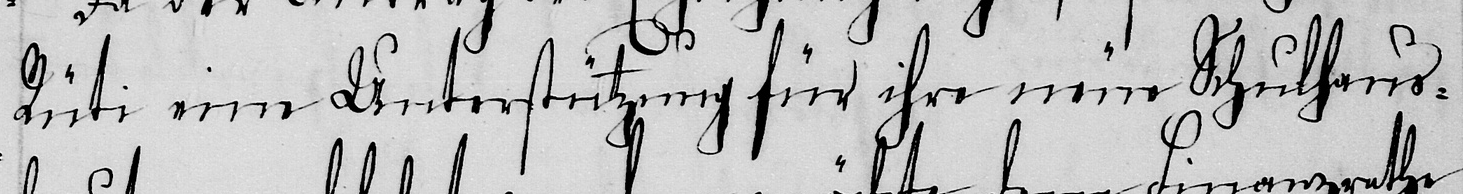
Rüti eine Unterstützung für ihre neue Schulhaus¬
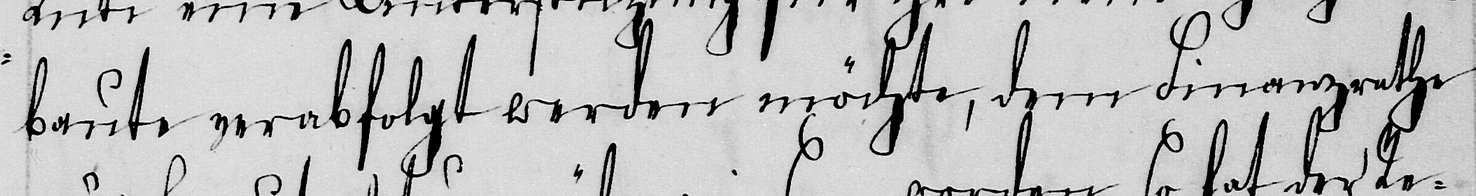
baute verabfolgt werden möchte, dem Finanzrathe
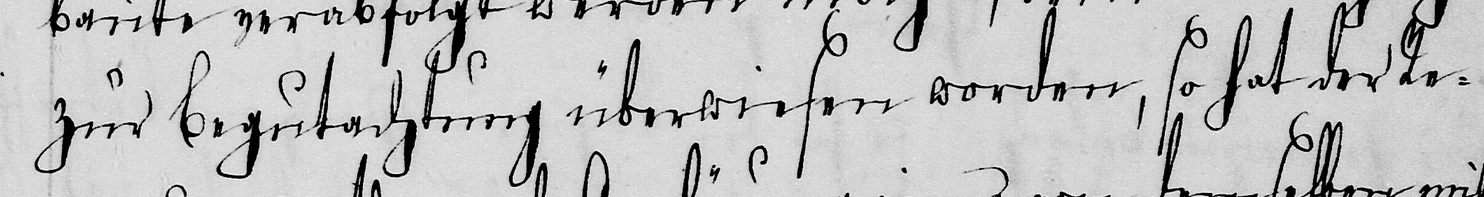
zur Begutachtung überwiesen worden, so hat der Re¬
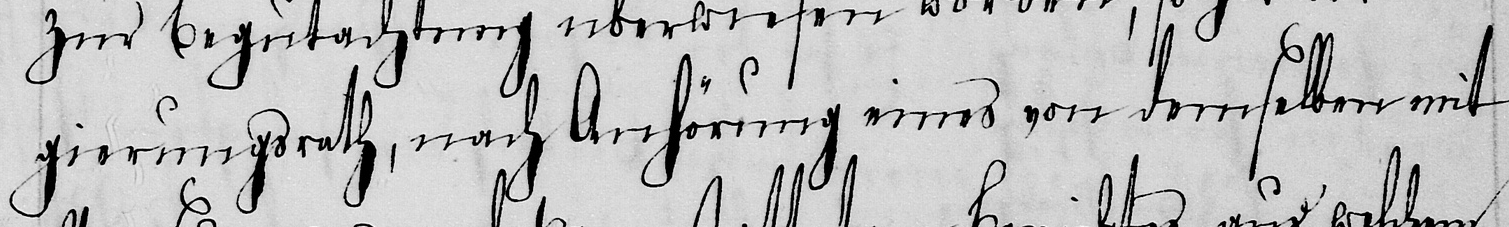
gierungsrath, nach Anhörung eines von demselben mit
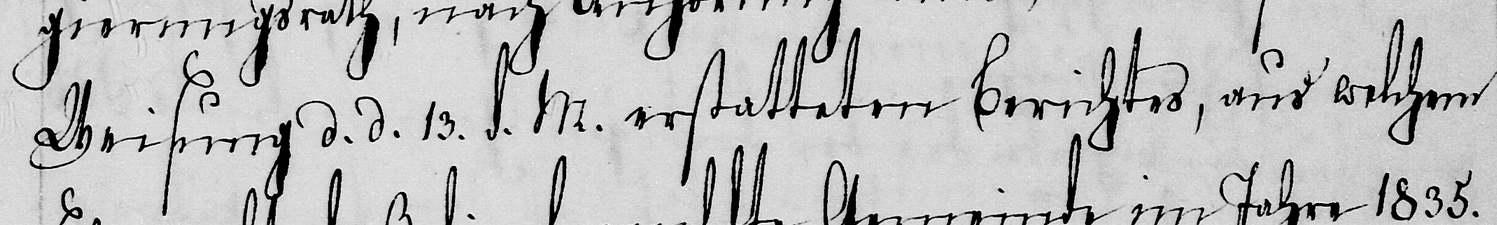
Weisung d. d. 13. d. M. erstatteten Berichtes, aus welchem
